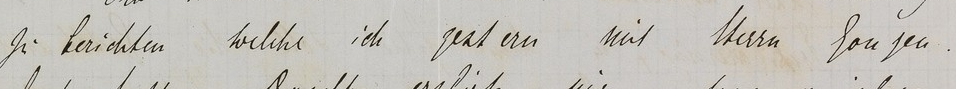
zu berichten welche ich gestern mit Herrn Gonzen-
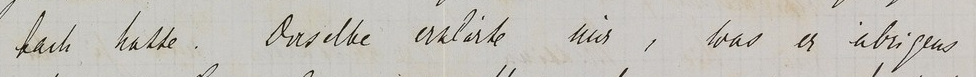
bach hatte. Derselbe erklärte mir, was er übrigens
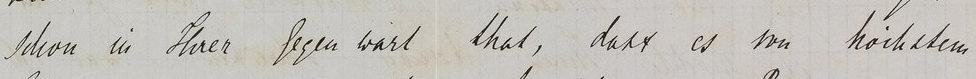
schon in Ihrer Gegenwart that, dass es von höchstem
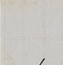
wäre,
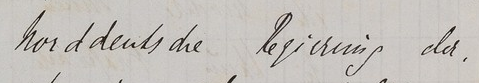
Norddeutsche Regierung der-
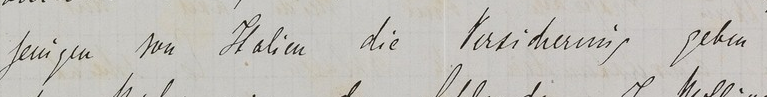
jenigen von Italien die Versicherung geben
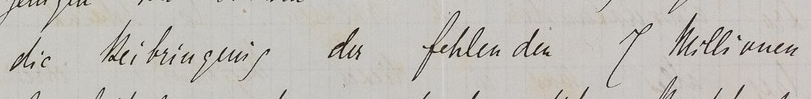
die Beibringung der fehlenden 7 Millionen sei
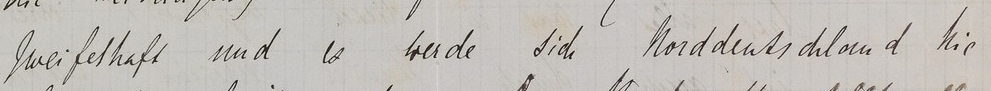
zweifelhaft und es werde sich Norddeutschland hie-
